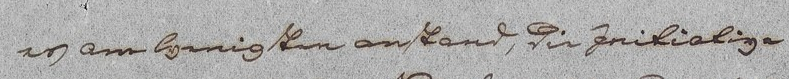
es am wenigsten anstand, die Initiative
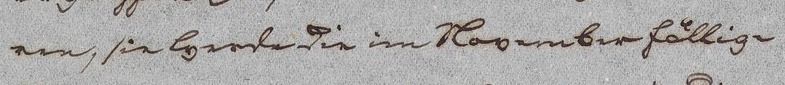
ren, sie werde die im November fällige
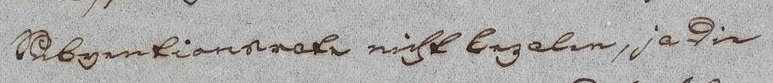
Subventionsrate nicht bezalen, ja die
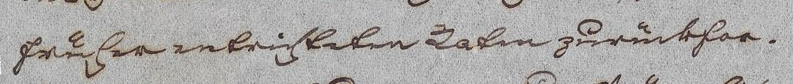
früher entrichteten Raten zurückfor-
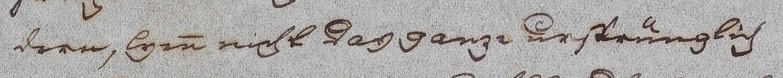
dern, wenn nicht das ganze ursprünglich
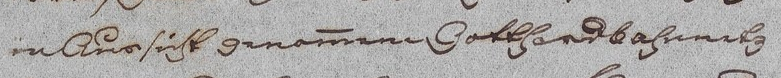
in Aussicht genommene Gotthardbahnnetz
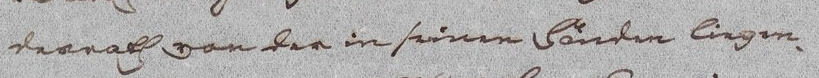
desrath von der in seinen Händen liegen-
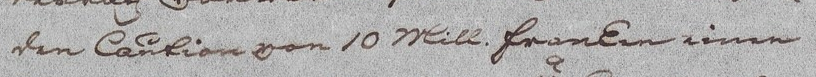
den Caution von 10 Mill. Franken einen
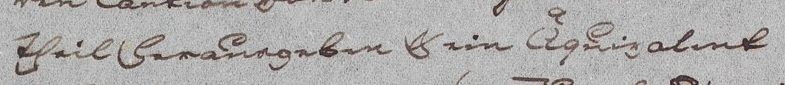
Theil herausgeben & ein Äquivalent
